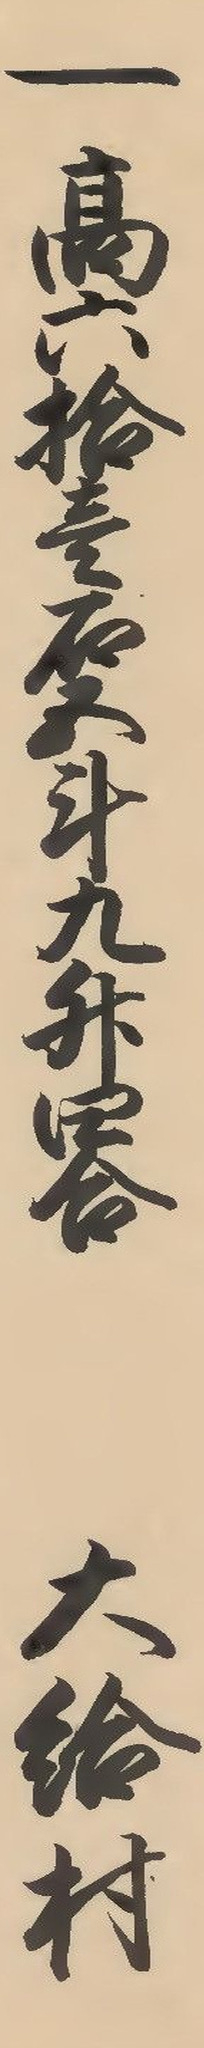一高六拾壱石五斗九升四合大給村
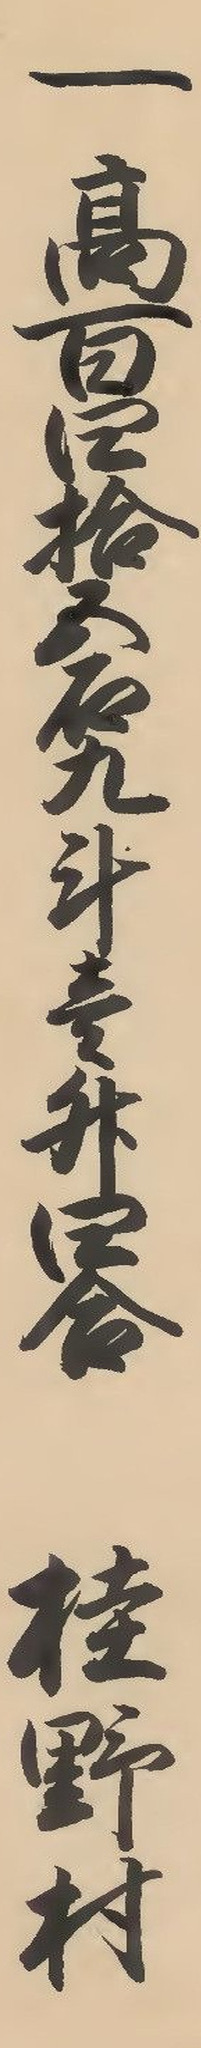一高百四拾五石九斗壱升四合桂野村
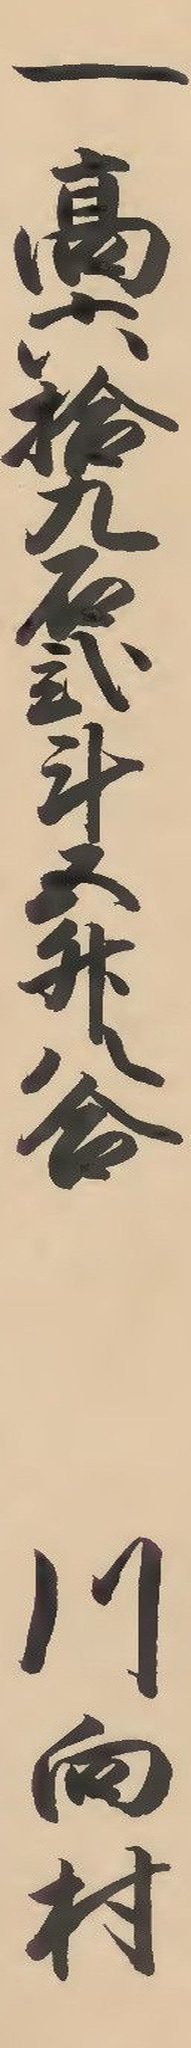一高六拾九石弐斗五升八合川向村
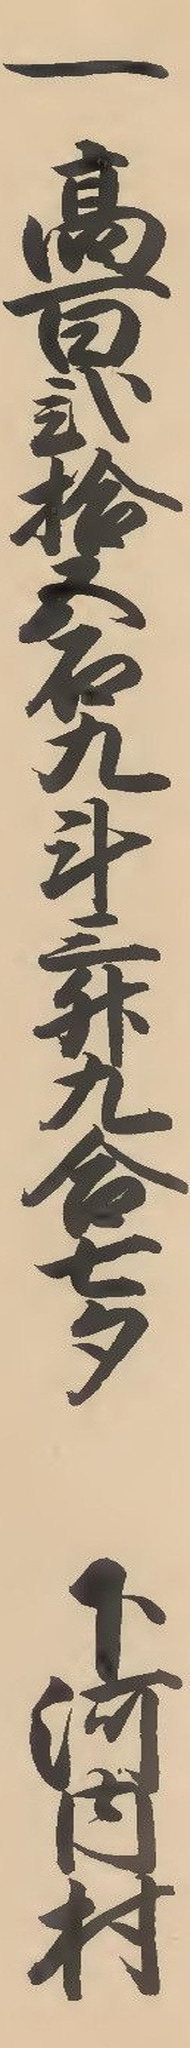一高百弐拾五石九斗三升九合七勺下河内村
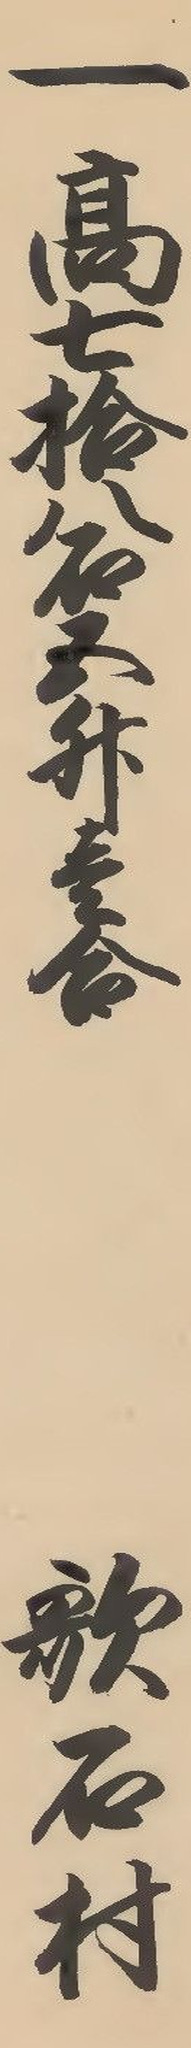一高七拾八石五升壱合歌石村
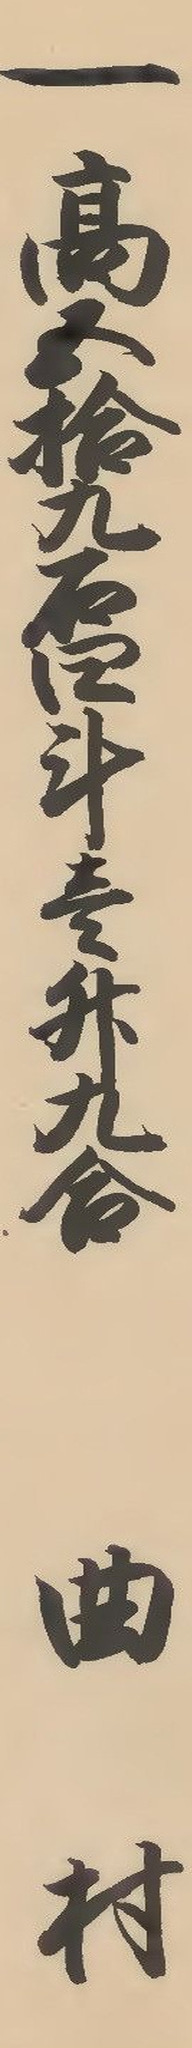一高五拾九石四斗壱升九合曲村
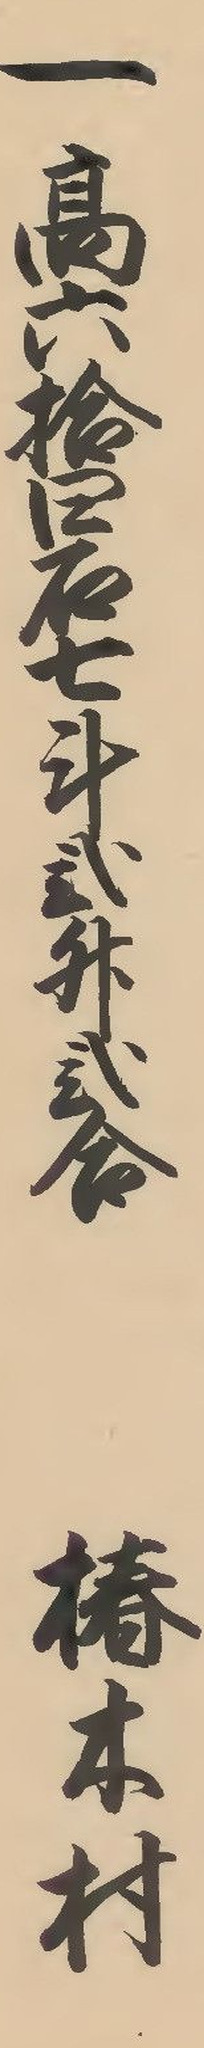一高六拾四石七斗弐升弐合椿木村

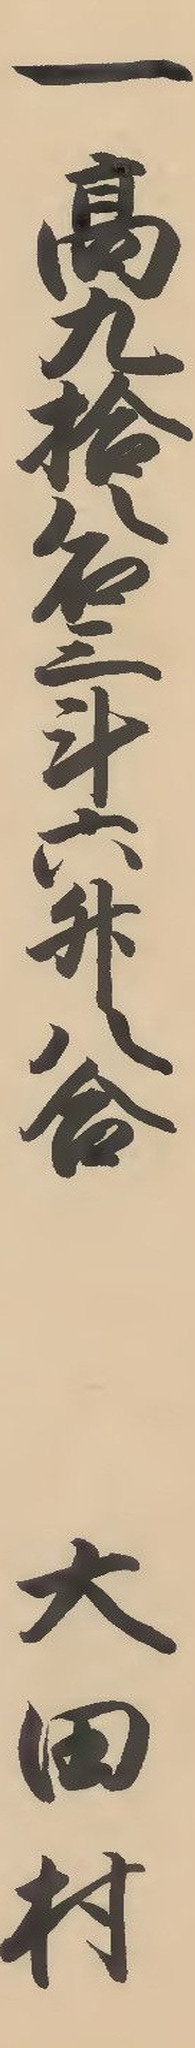一高九拾八石三斗六升八合大田村
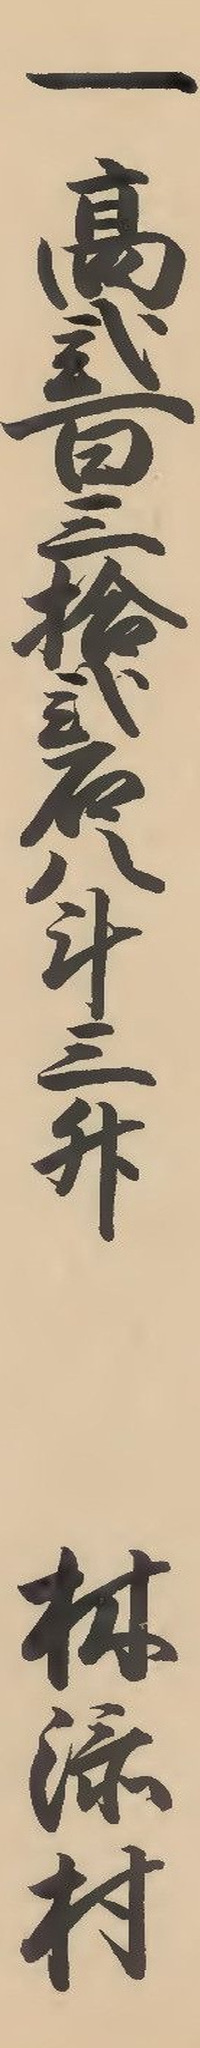一高弐百三拾弐石八斗三升林添村
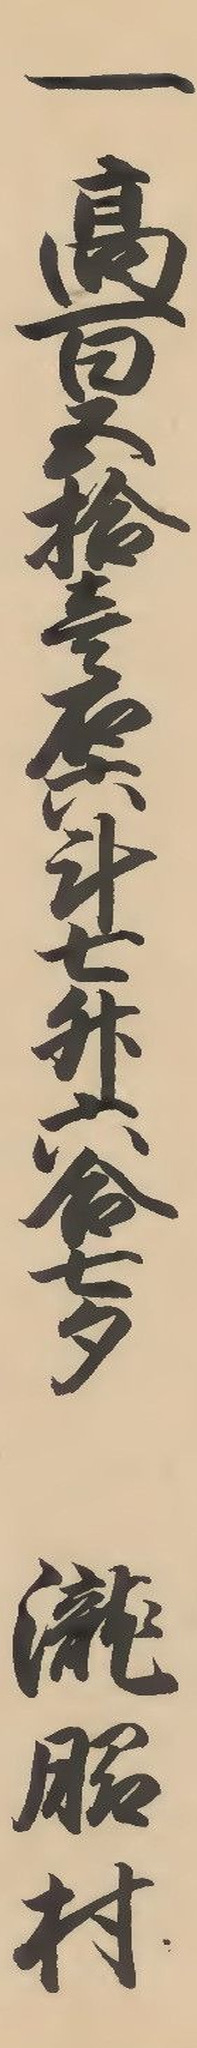一高百五拾壱石六斗七升六合七勺滝脇村
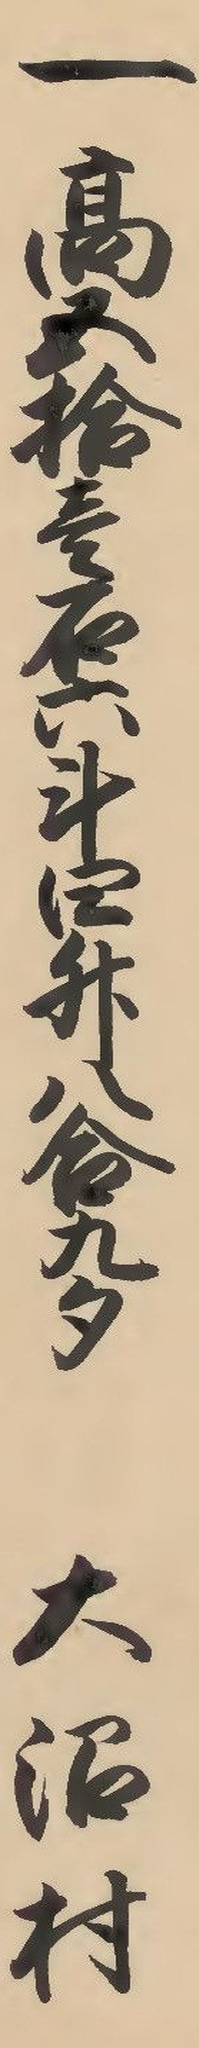一高五拾壱石六斗四升八合九勺大沼村
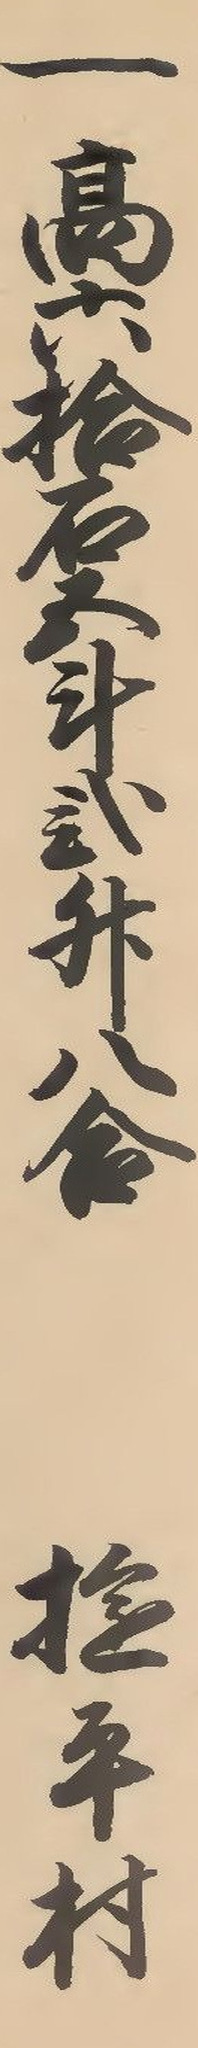一高六拾石五斗弐升八合遊平村
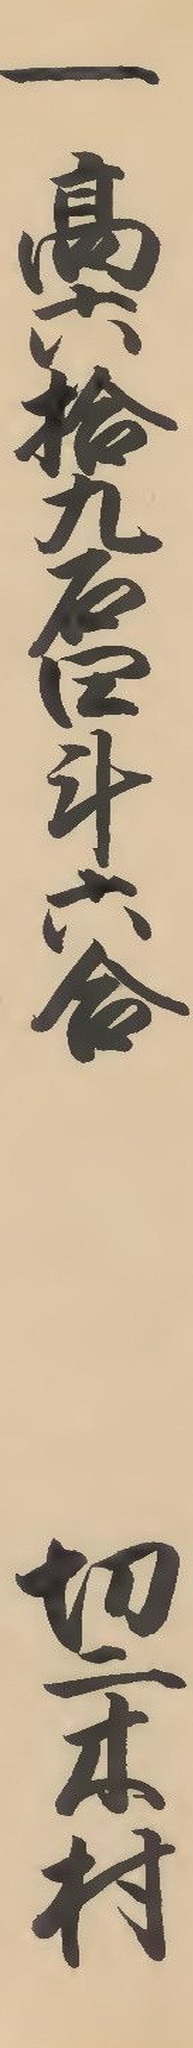一高六拾九石四斗六合切二木村
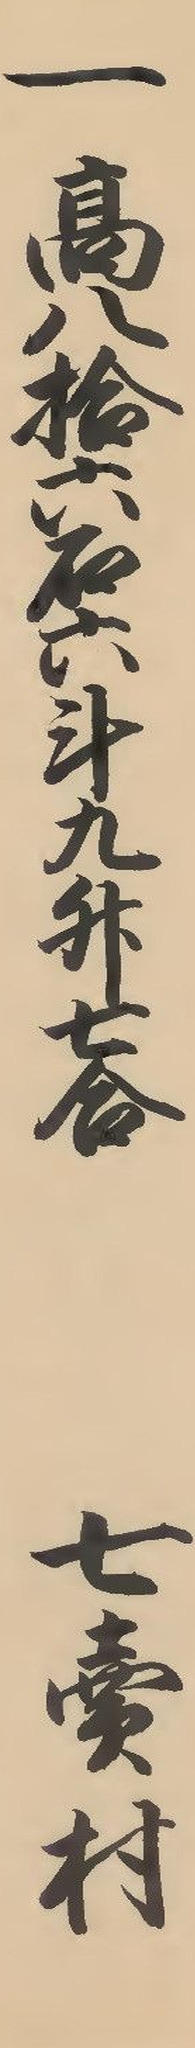一高八拾六石六斗九升七合七売村
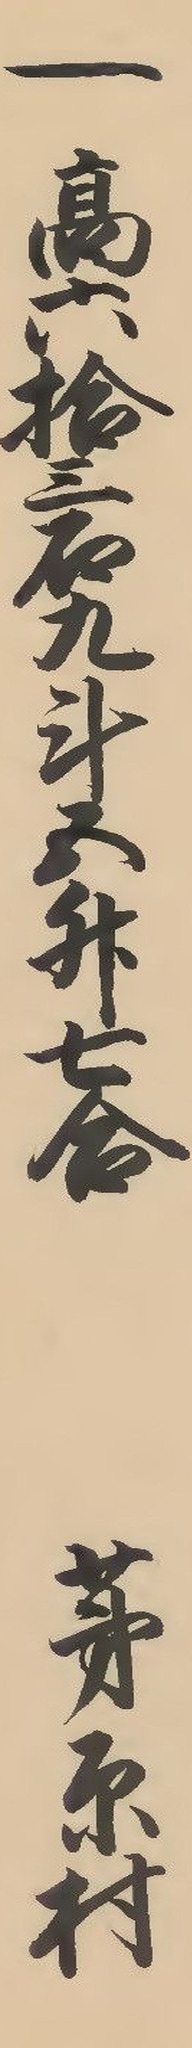一高六拾三石九斗五升七合茅原村

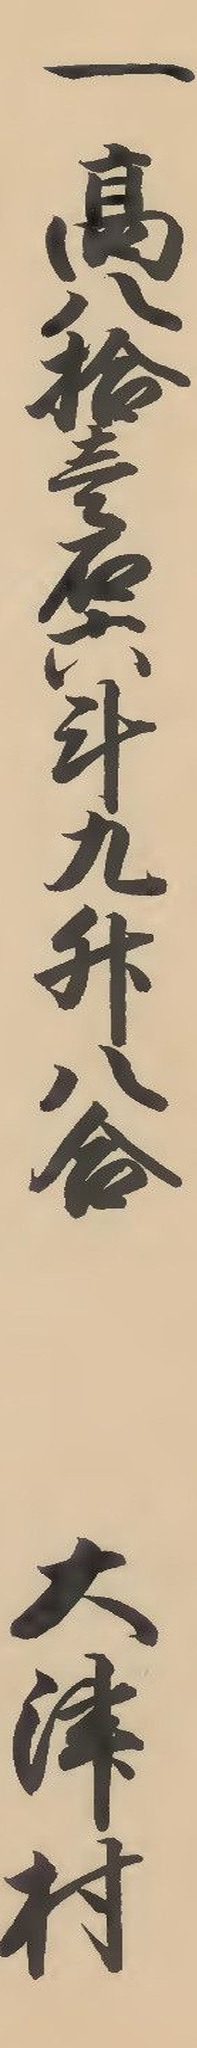一高八拾壱石六斗九升八合大津村
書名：三河国郷帳
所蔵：国立公文書館 National Archives of Japan
